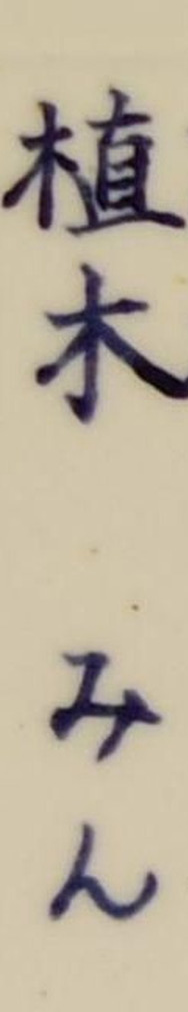植木みん
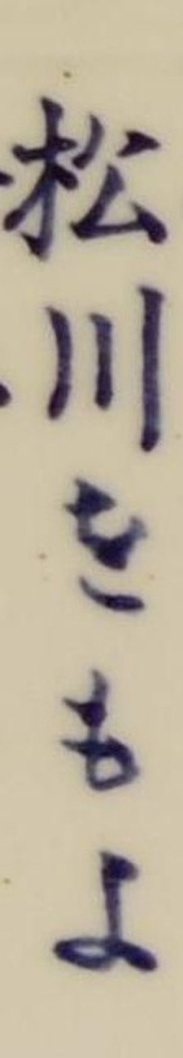松川をもよ
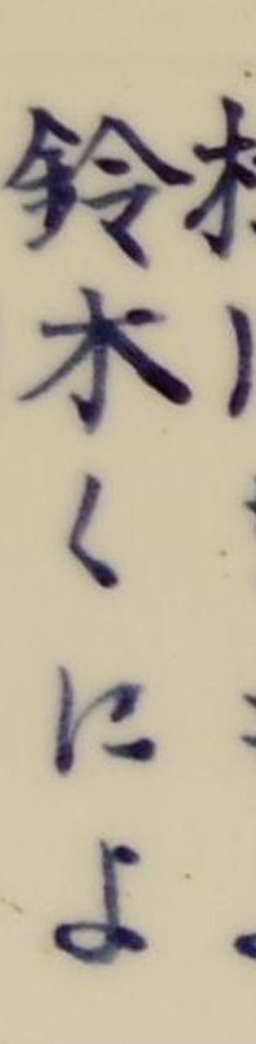鈴木くによ
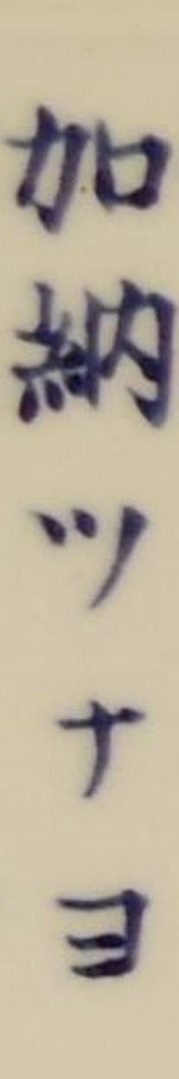加納ツナヨ
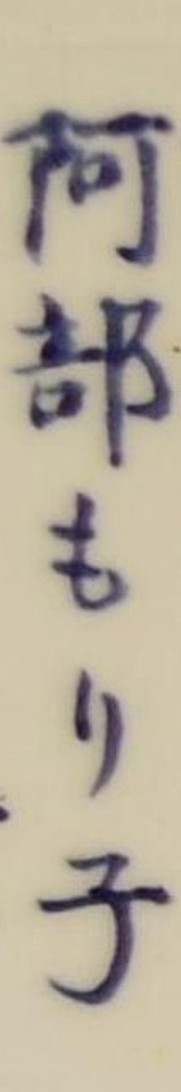阿部もり子
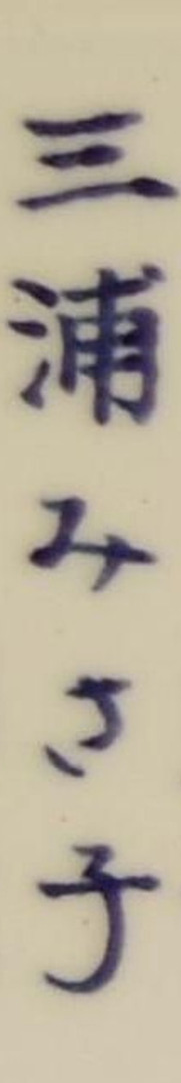三浦みさ子
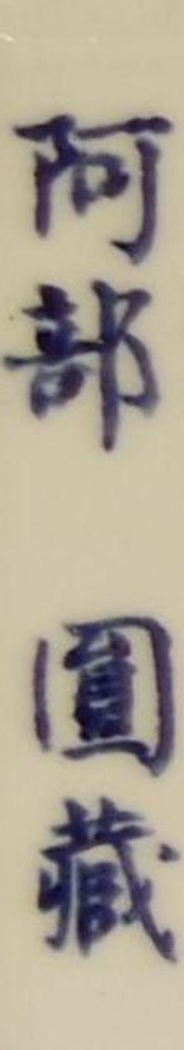阿部円蔵

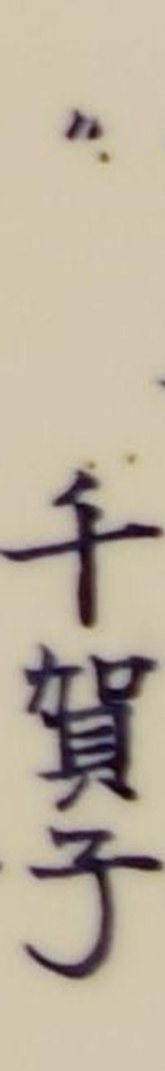千賀子
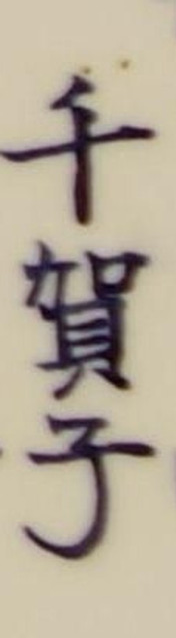千賀子
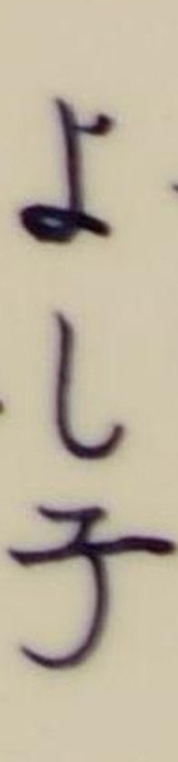よし子
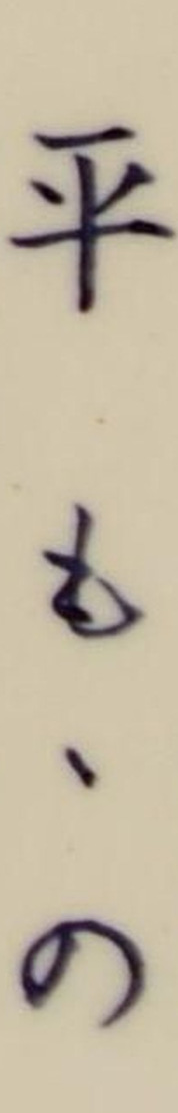平もゝの
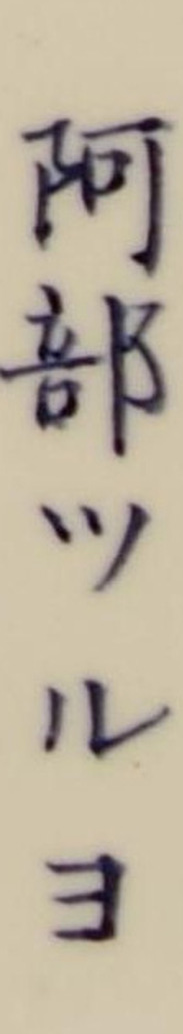阿部ツルヨ
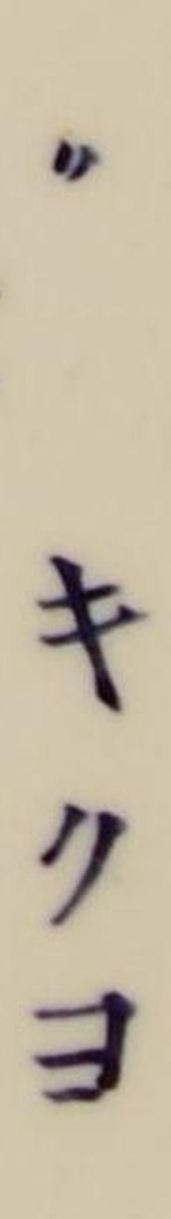キクヨ
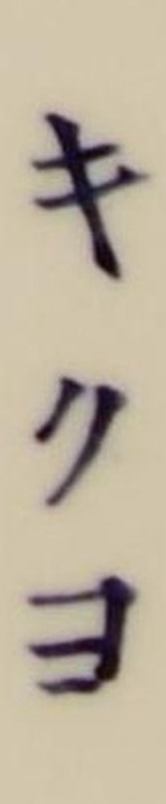キクヨ
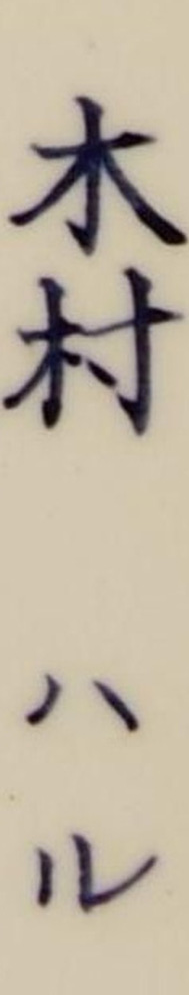木村ハル
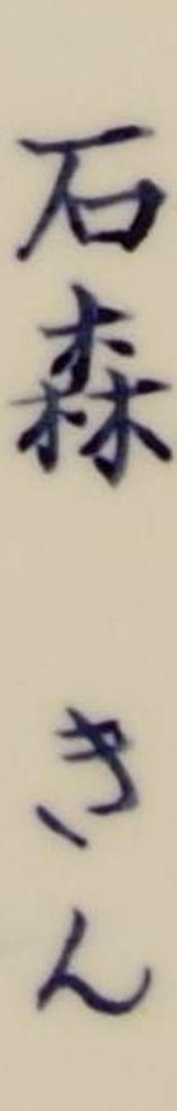石森きん
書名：A~D
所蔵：koyasan kongobuji
